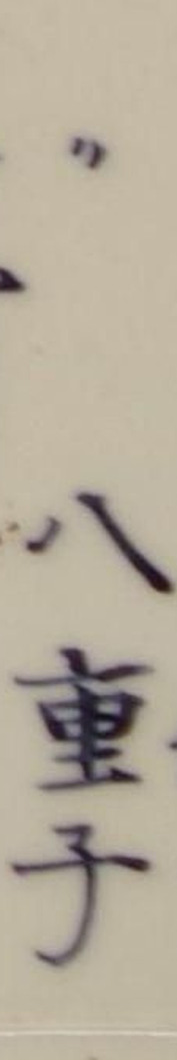八重子
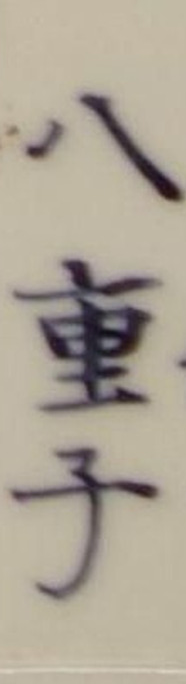八重子
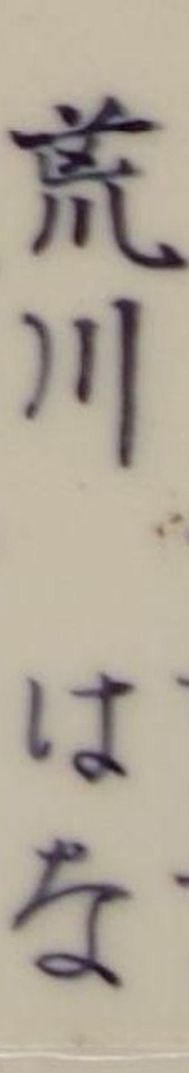荒川はな
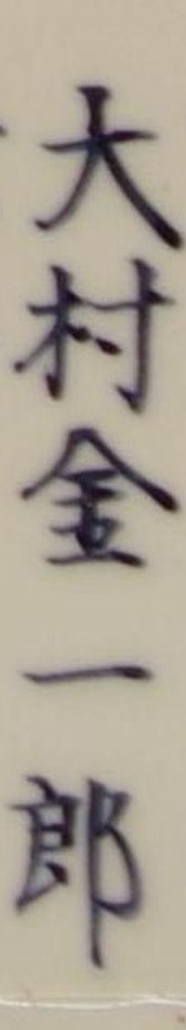大村金一郎
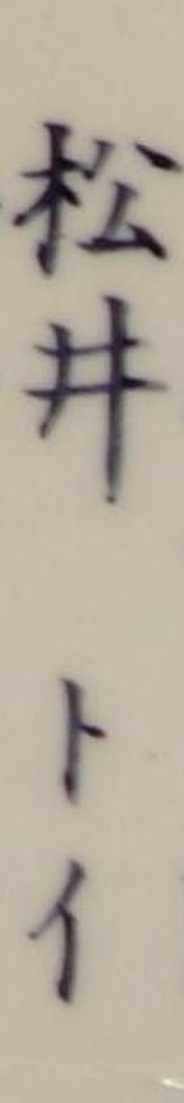松井トイ
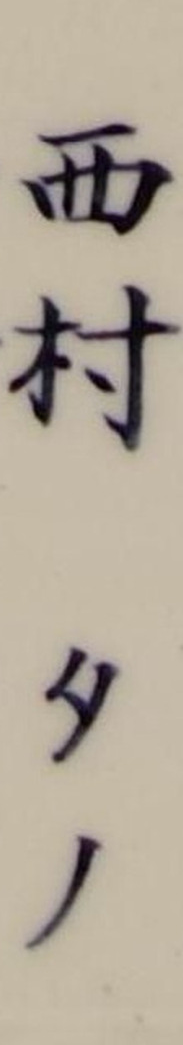西村タノ
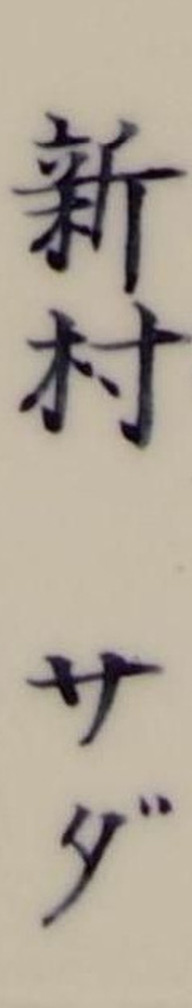新村サダ
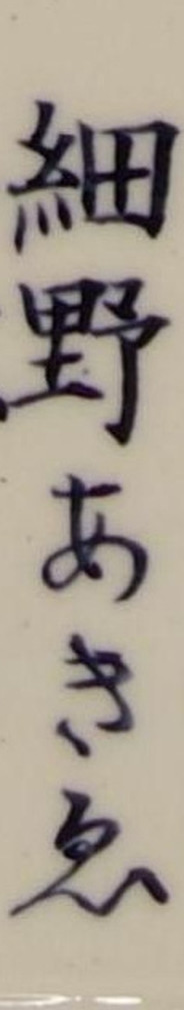細野あきえ
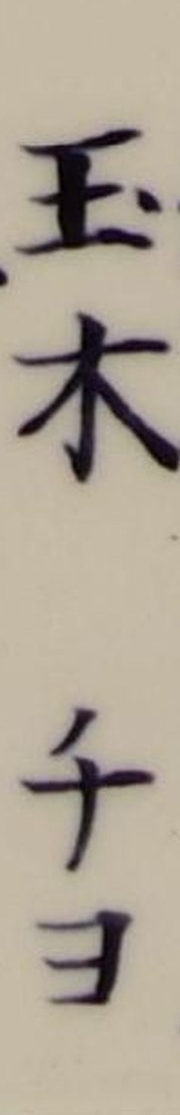玉木チヨ
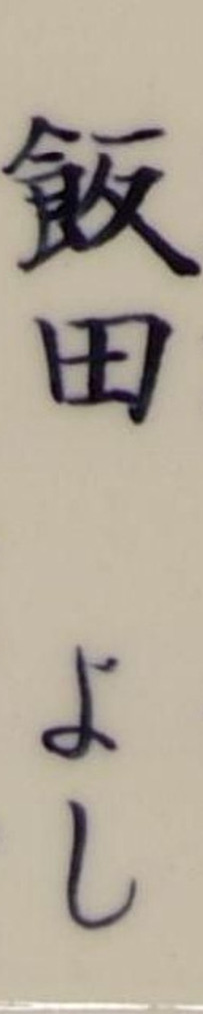飯田よし
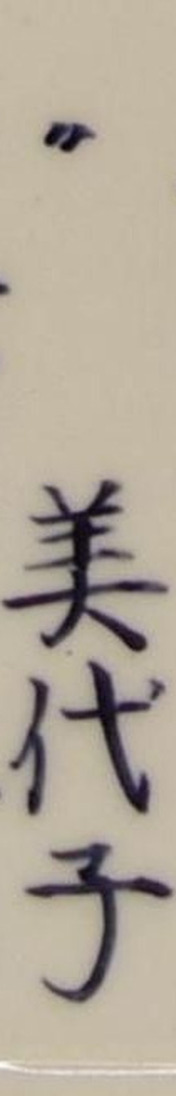美代子
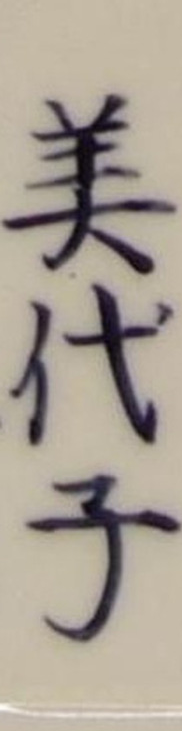美代子
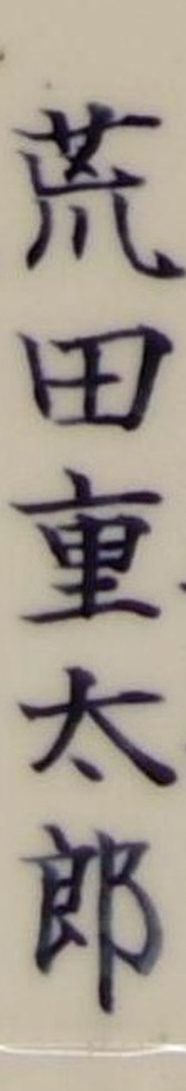荒田重太郎
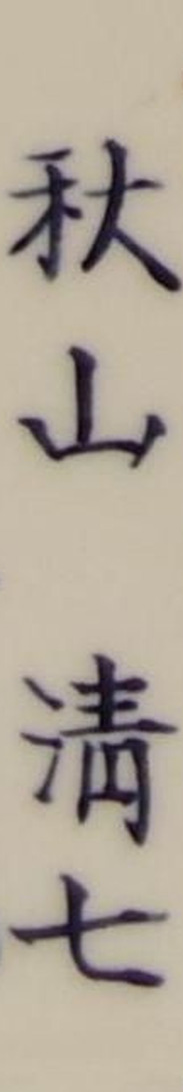秋山清七
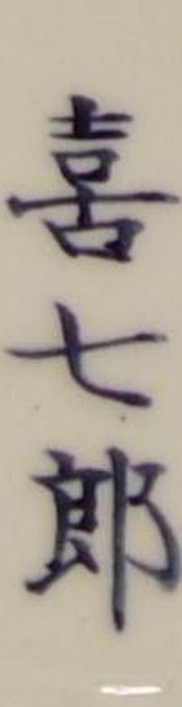喜七郎
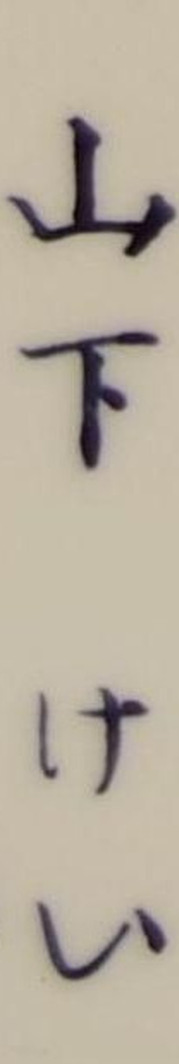山下けい
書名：M~S
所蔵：高野山金剛峯寺
